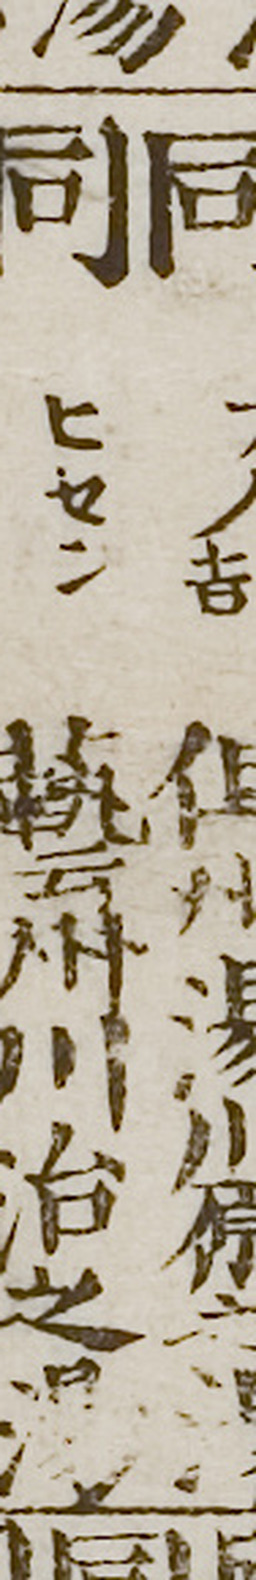同ヒセン芸州川治之湯
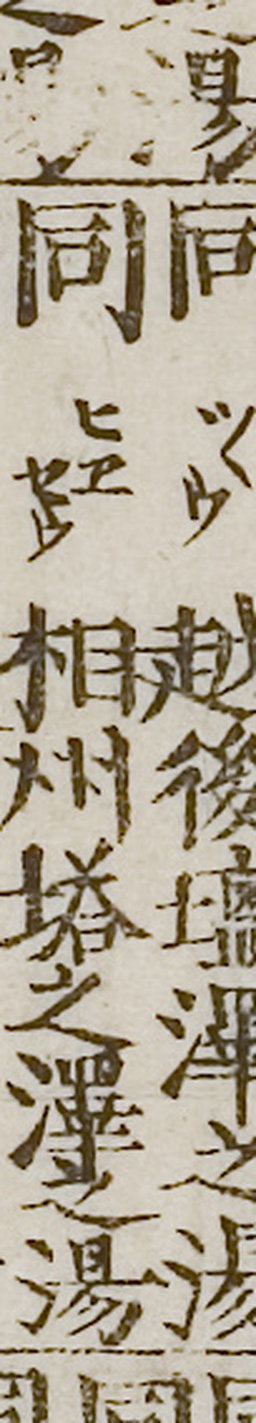同ヒエセウ相州塔之沢之湯
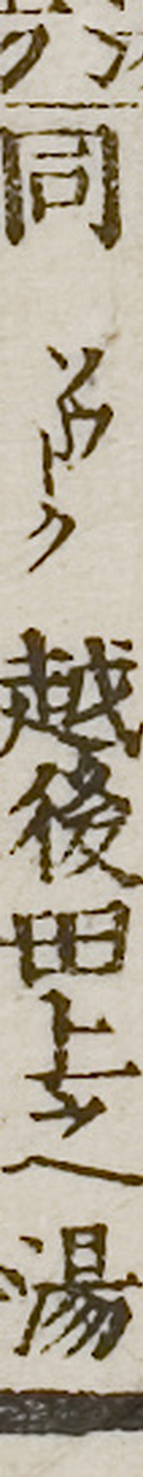同ソウトク越後田上之湯
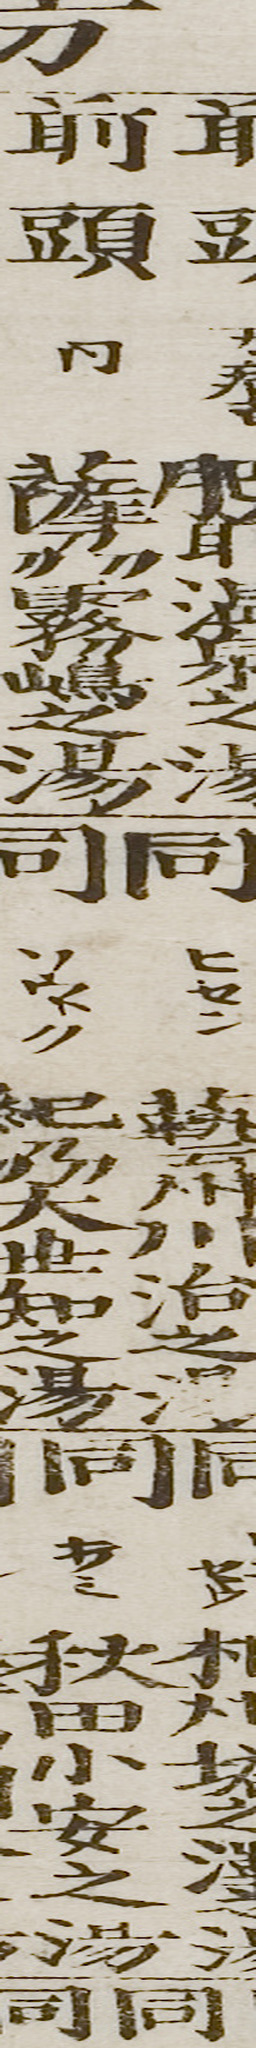前頭同薩州霧嶋之湯
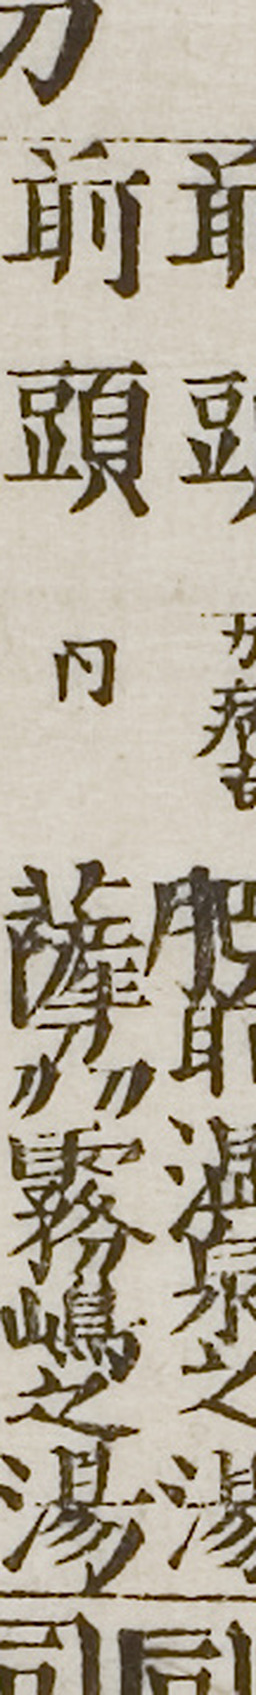前頭同薩州霧嶋之湯
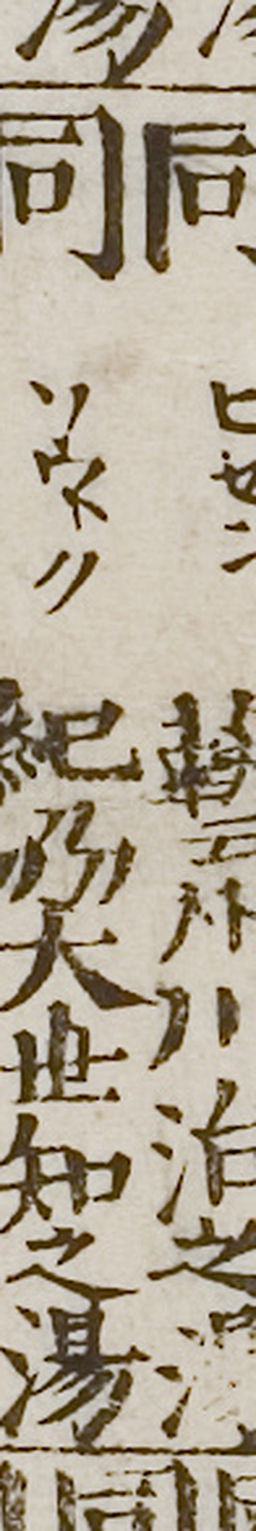同ソウトク紀州大世知之湯
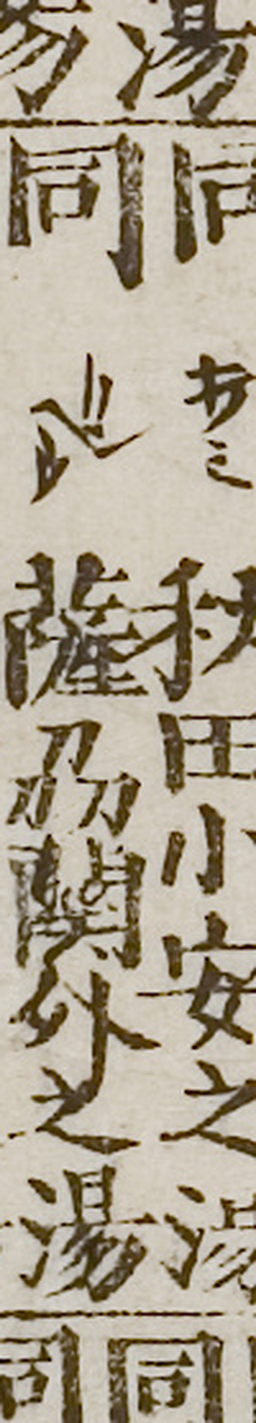同リンヘウ薩州関外之湯
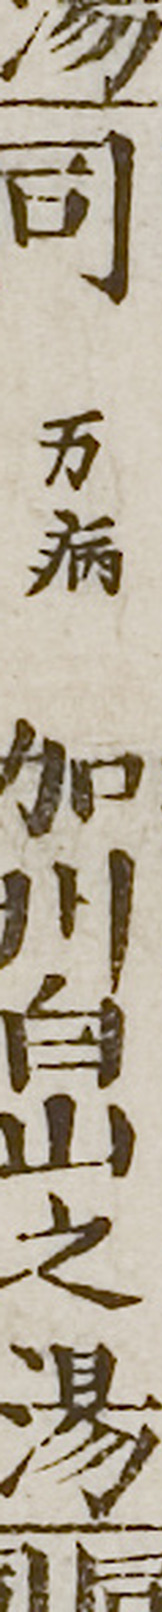同万病加州白山之湯
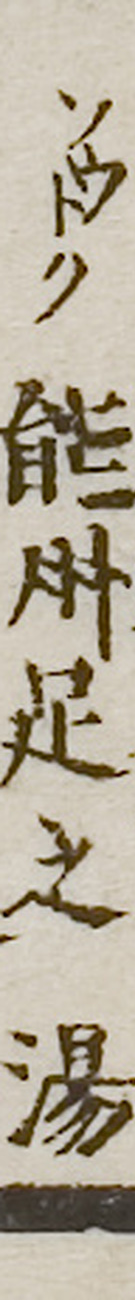同ソウトク能州足之湯
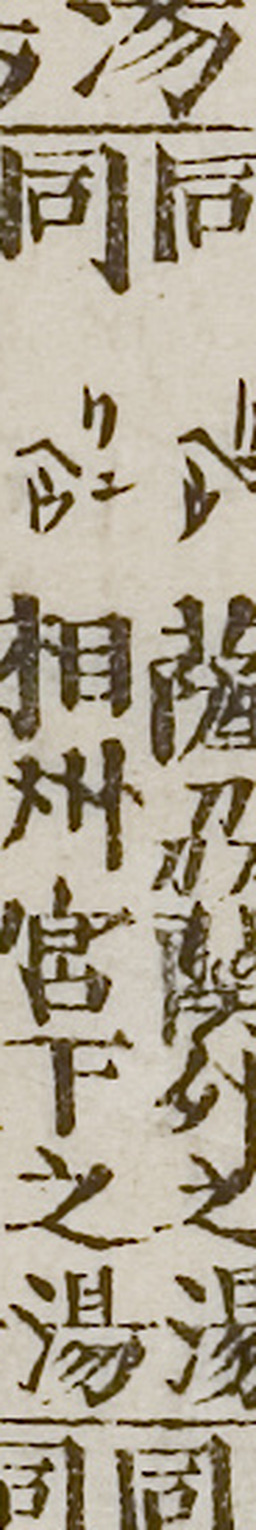同リンヘウ相州宮下之湯
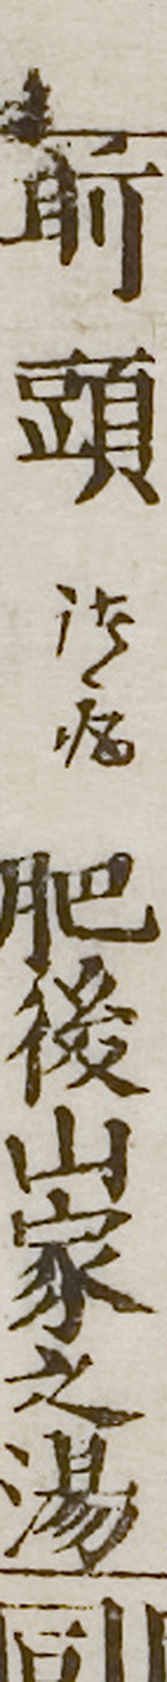前頭諸病肥後山家之湯
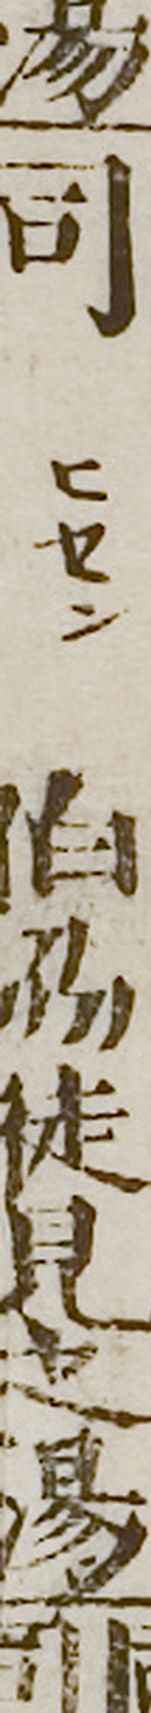同ヒセン伯州徒見之湯
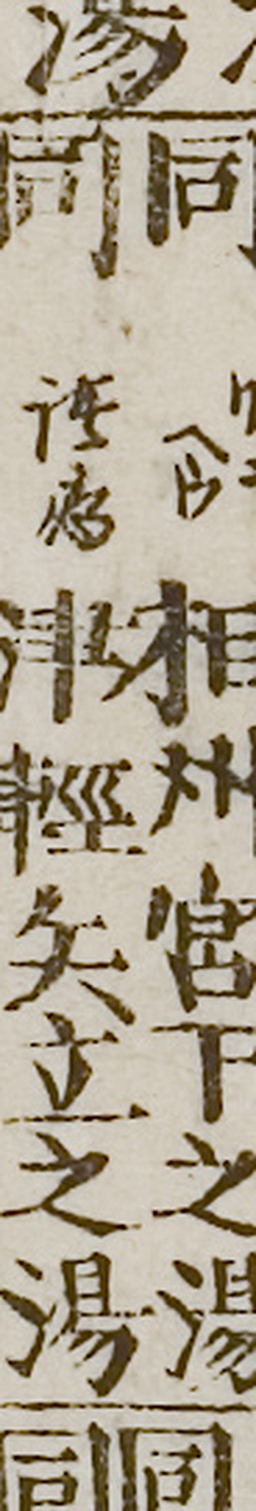同諸病津軽矢立之湯
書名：諸国温泉一覧
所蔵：東京大学総合図書館 General Library in the University of Tokyo, JAPAN
